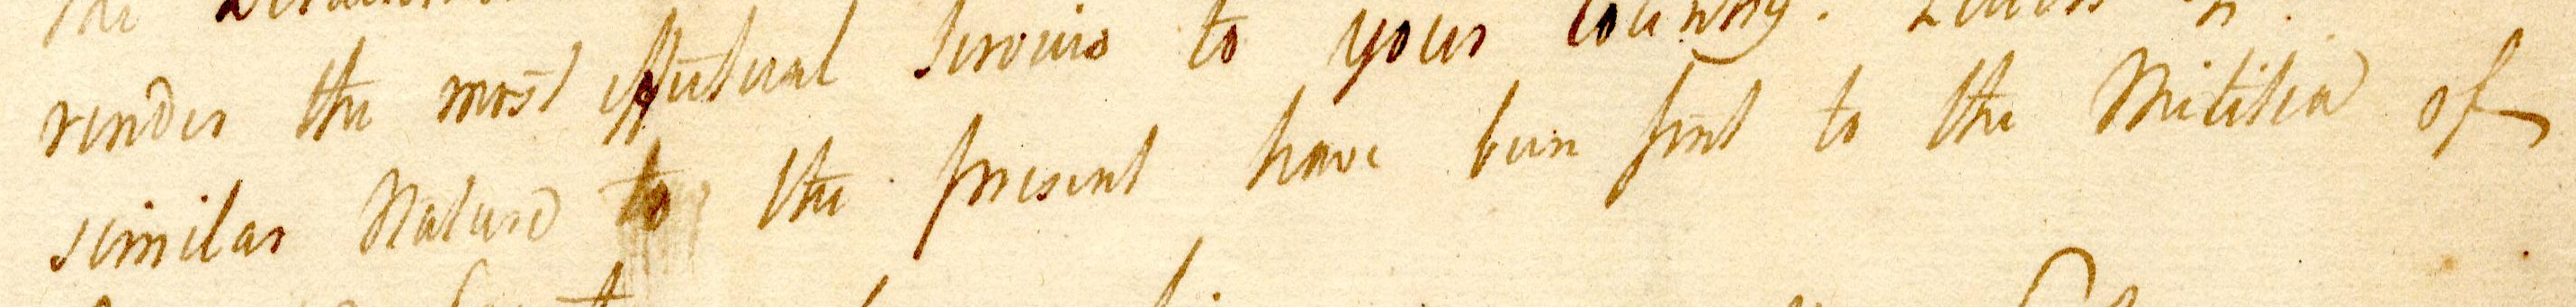similar Nature to the present have been sent to the Militia of
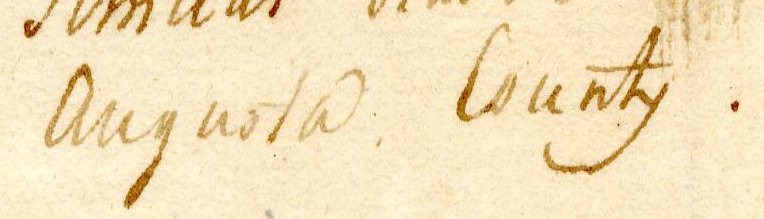Augusta County.
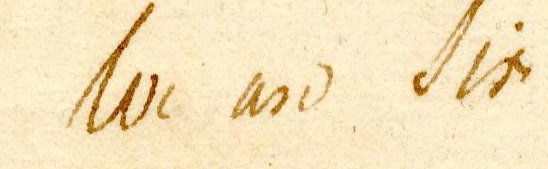We are Sir
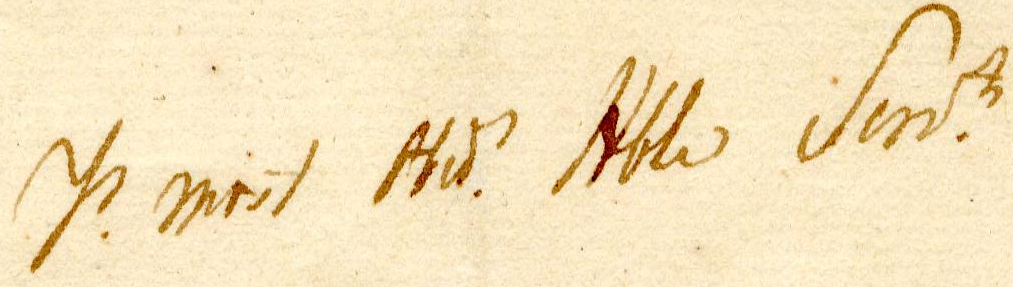Y^r most Obed^t Hble Serv^t.
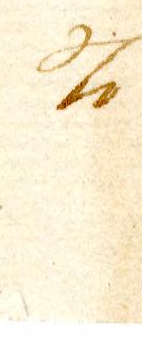To
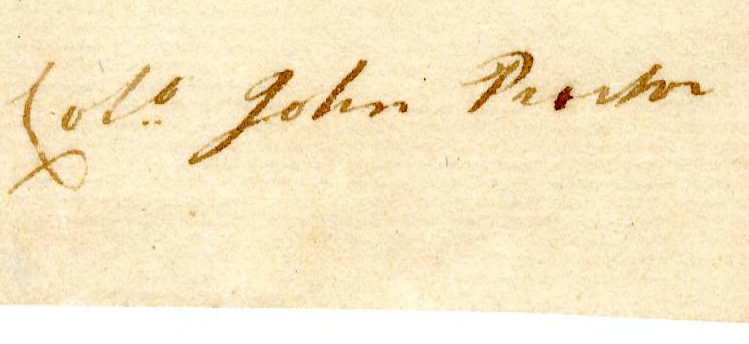Col^o John Proctor
